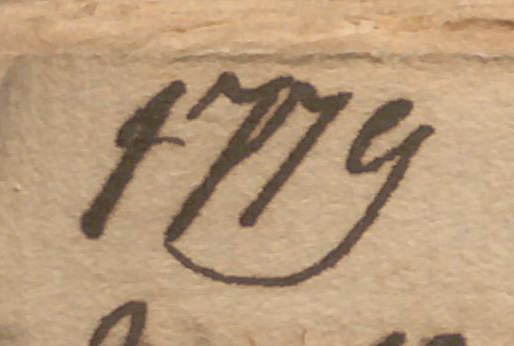1779
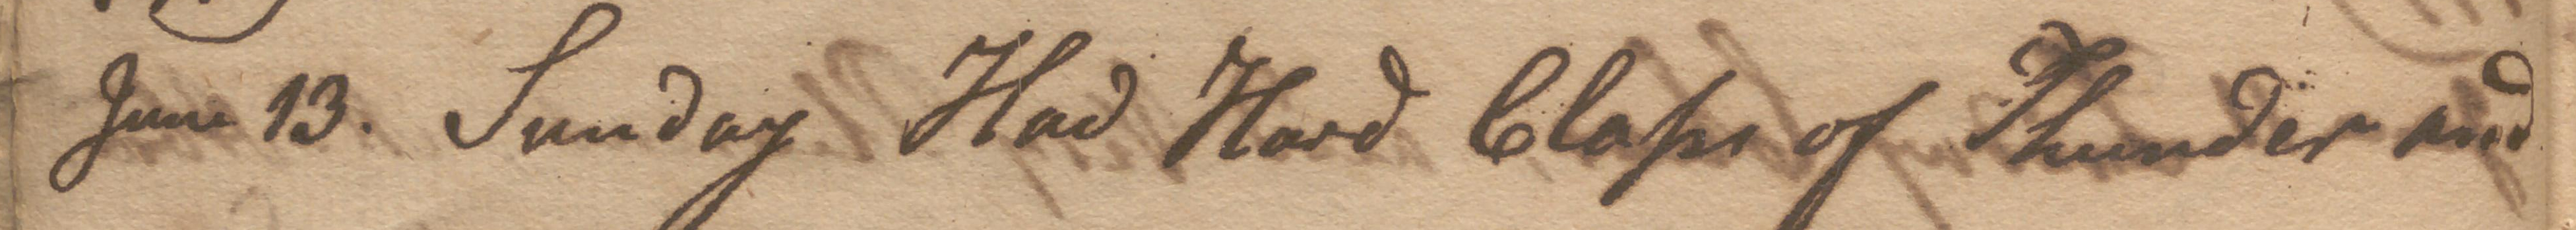June 13. Sunday Had Hard Claps of Thunder and
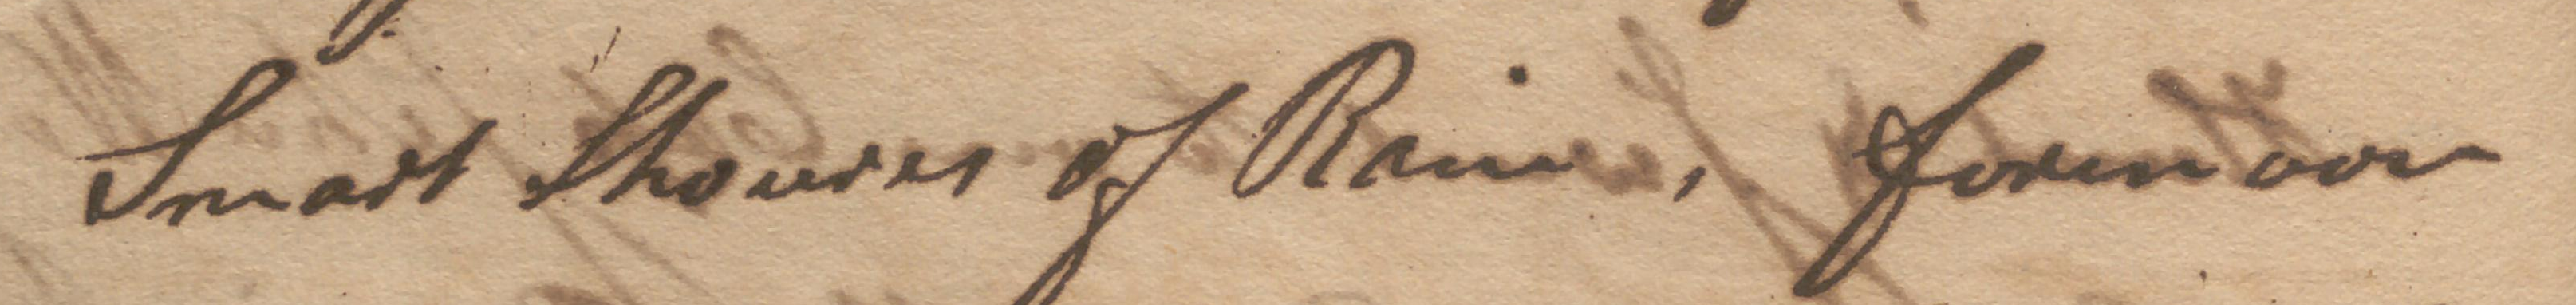Smart Shoures of Rain, forenoon
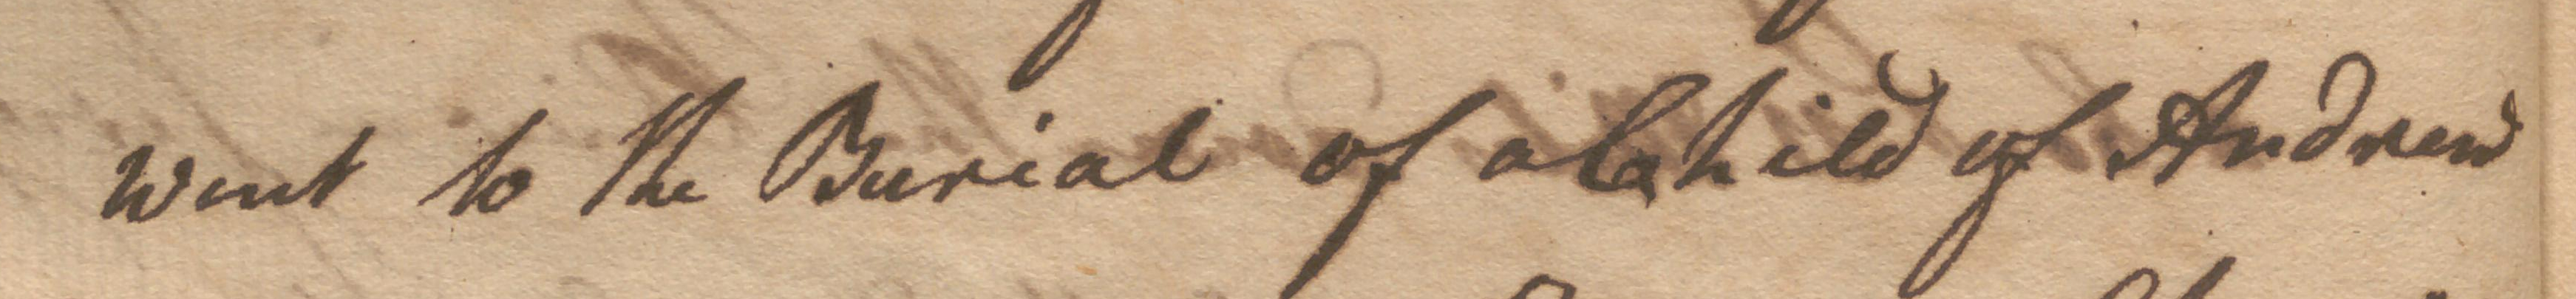went to the Burial of a Child of Andrew
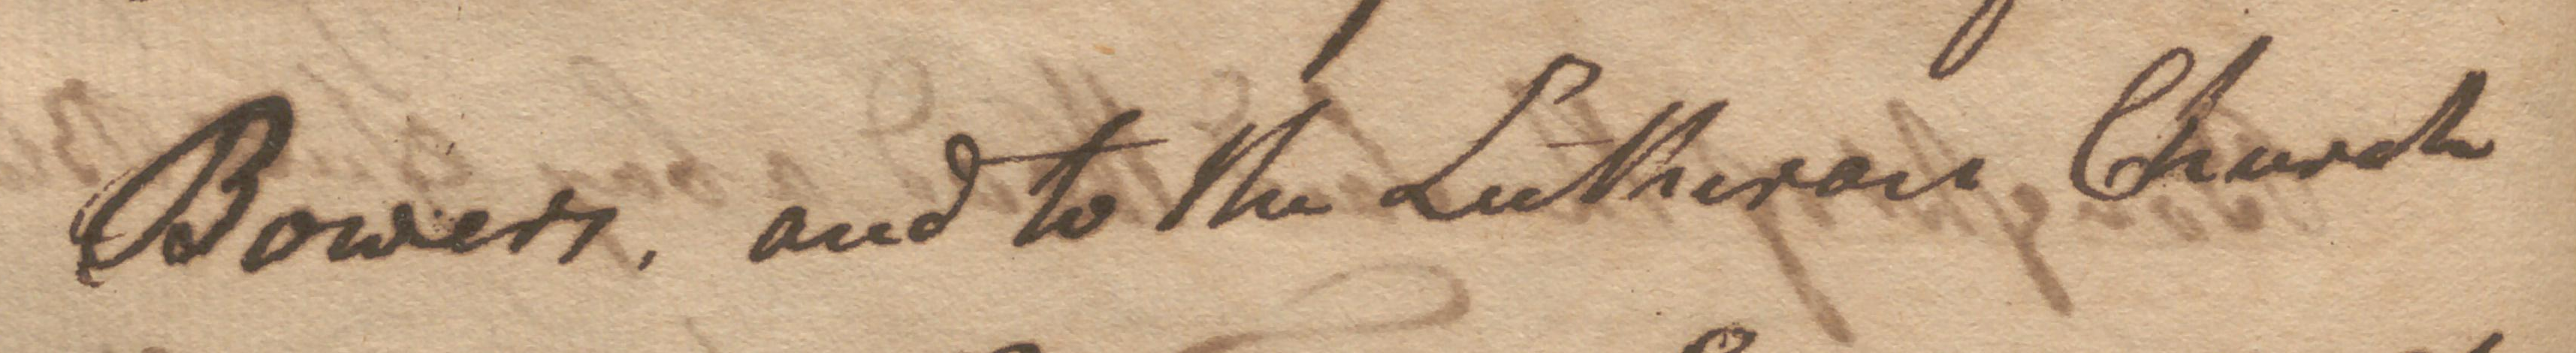Bowers, and to the Lutheran Church
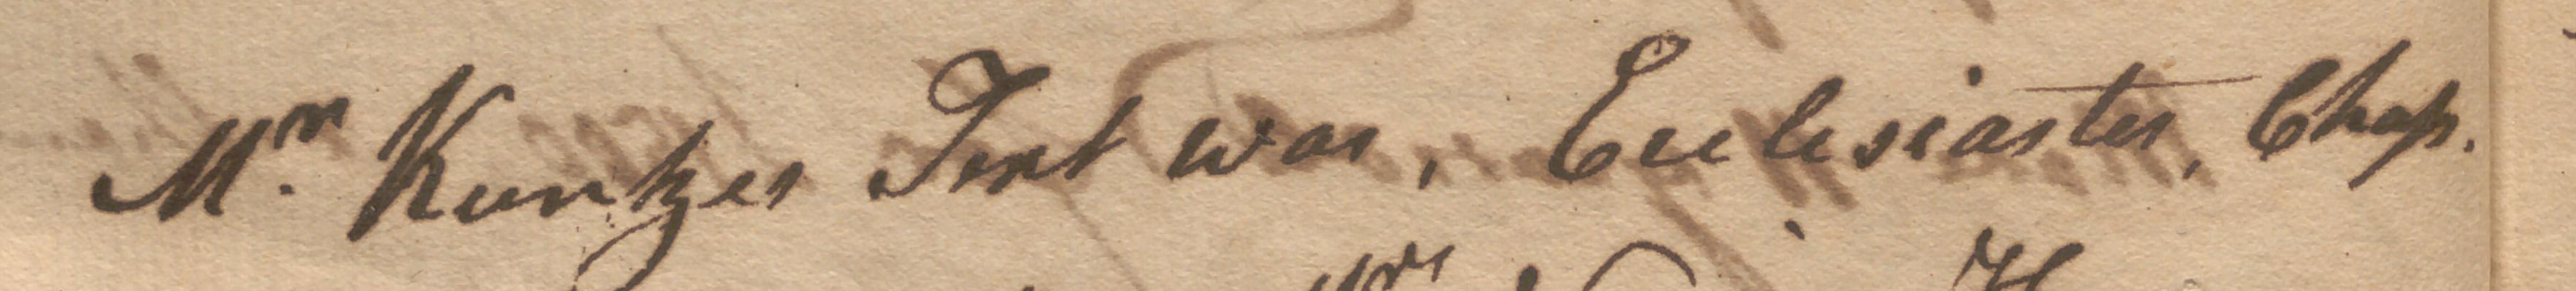M^r. Kuntzes Text was. Ecclesiastes, Chap
